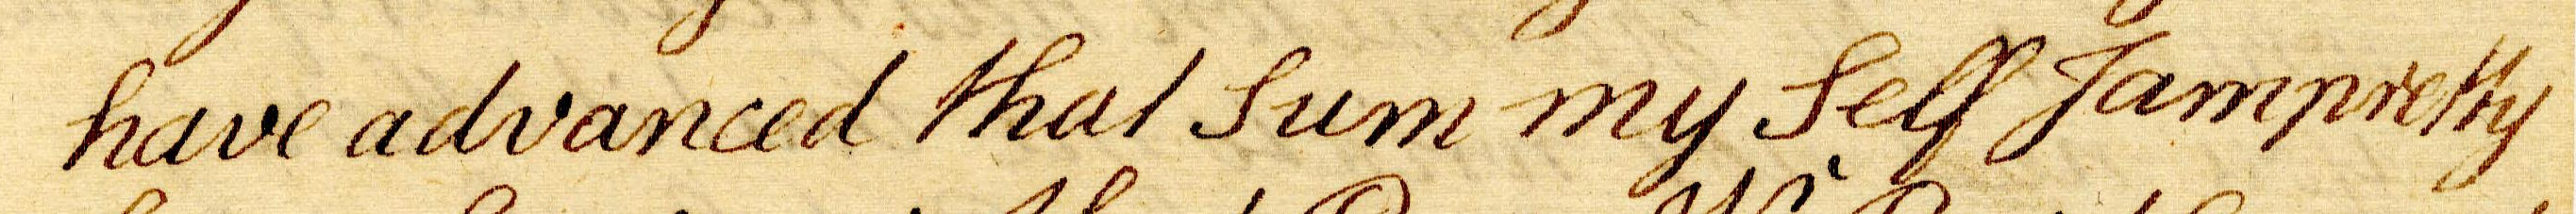have advanced that sum my Self Iampretty
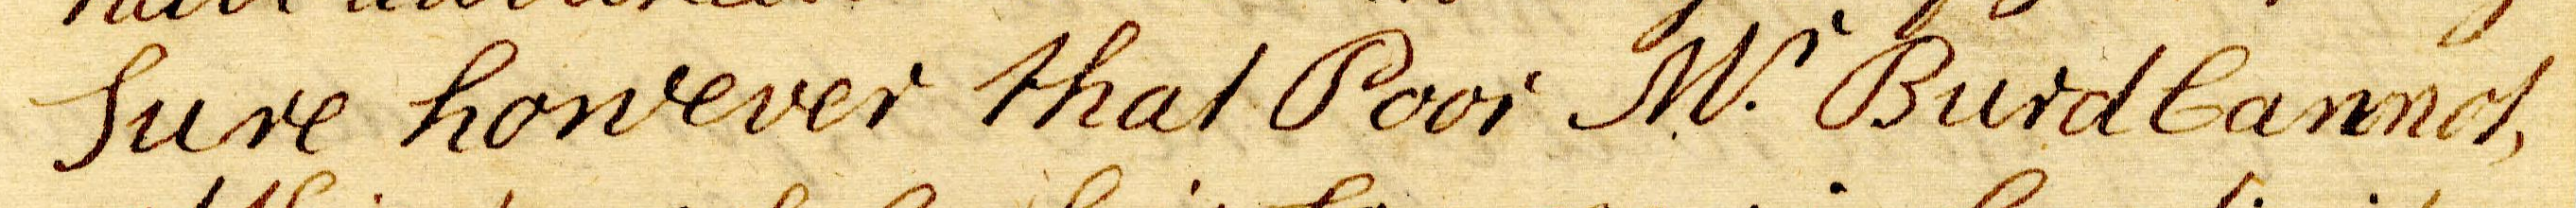sure however that Poor M^r. Burd Cannot,
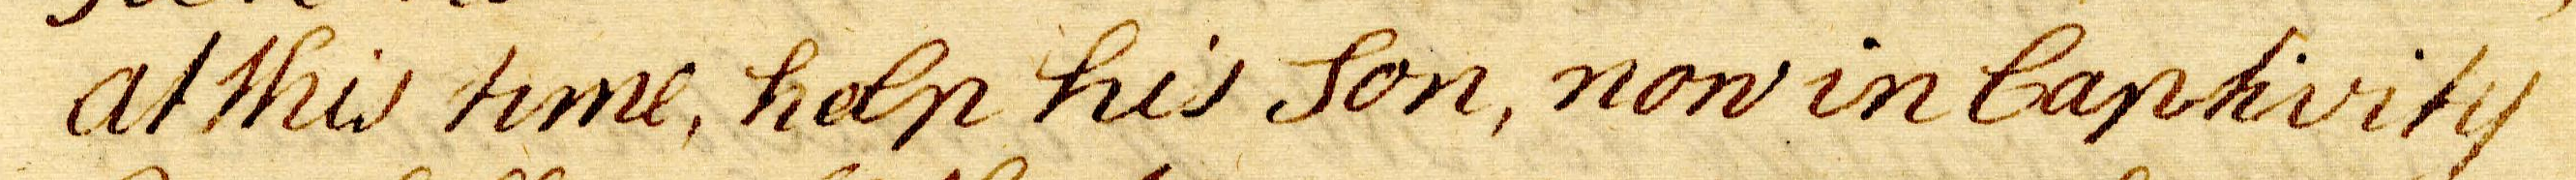At this time, help his Son, now in Captivity
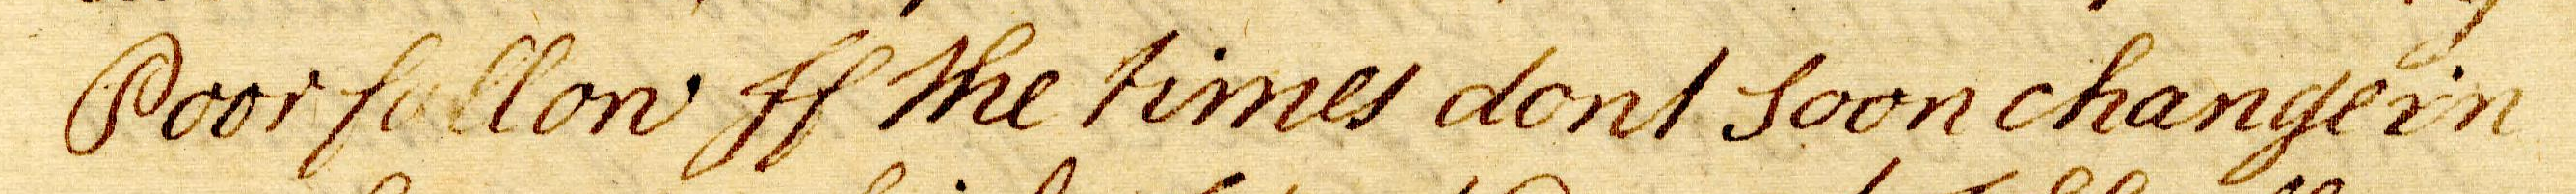Poor fellon If the times dont soon change in
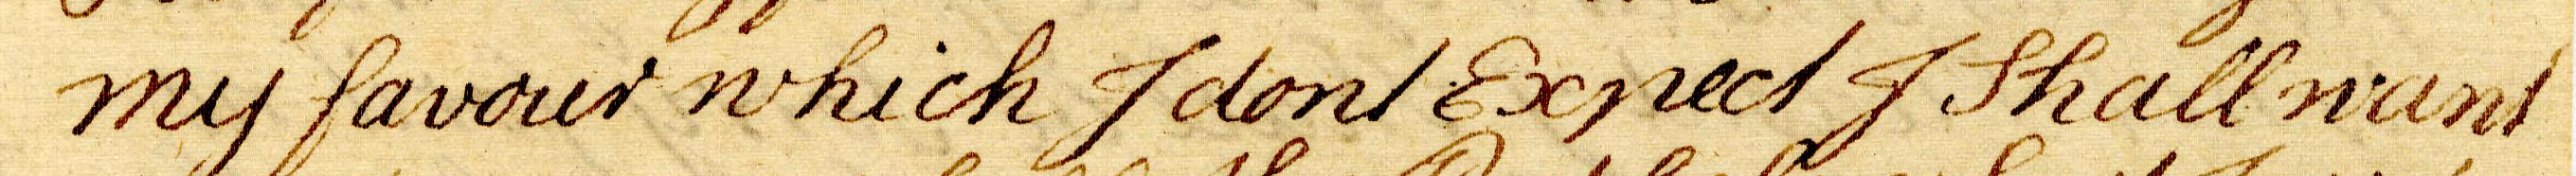My favour which I dont Expect I Shall want
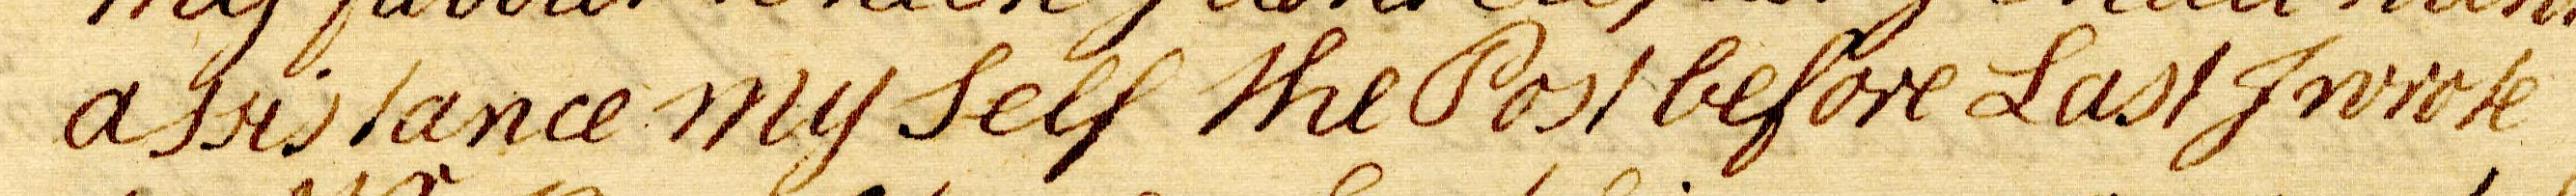assistance my Self the Post before Last I wrote
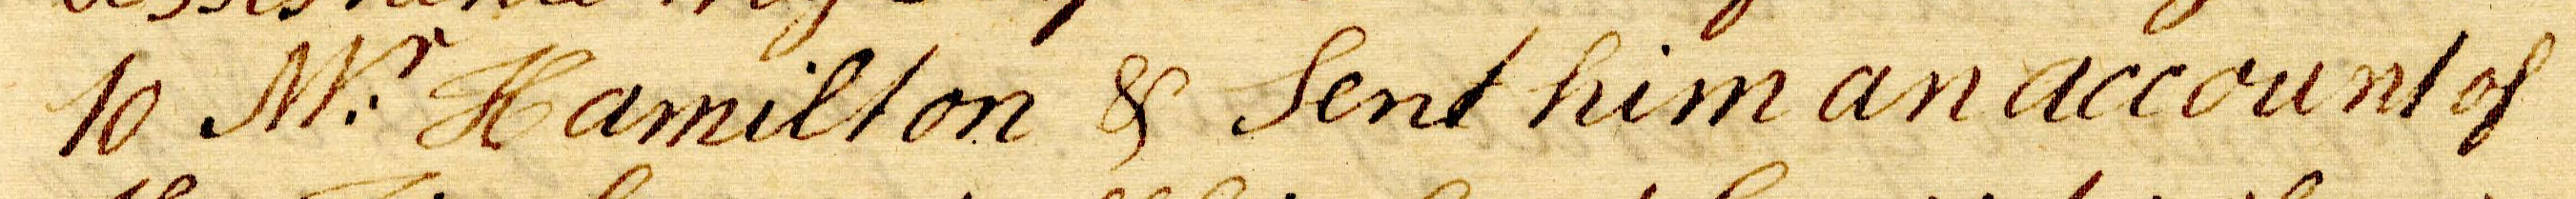to M^r. Hamilton & Sent him an account of
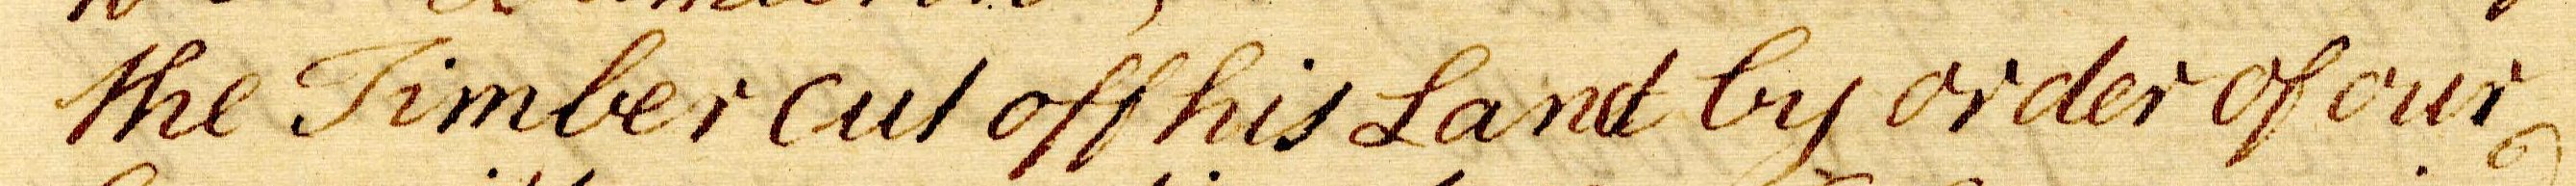the Timber cut off his Land by order of our
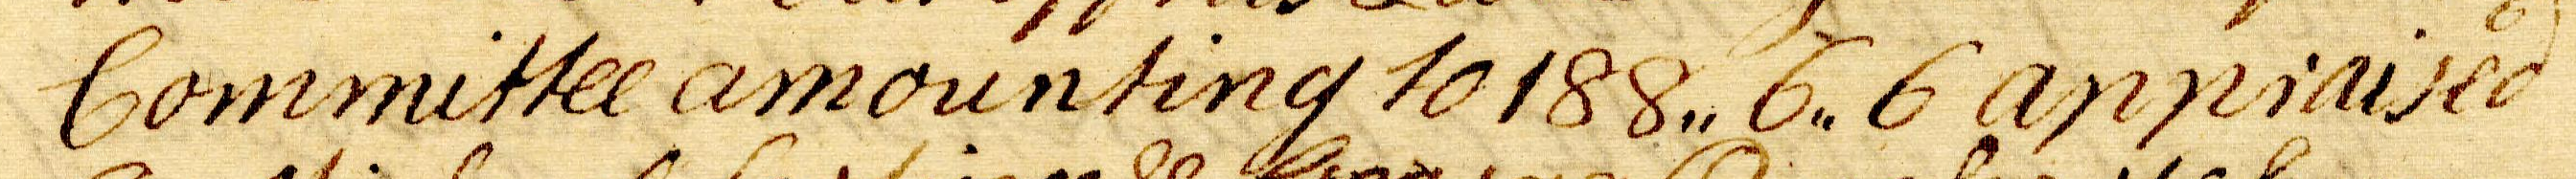Committee amounting to 188..6..6 appraised
